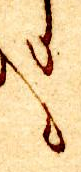To
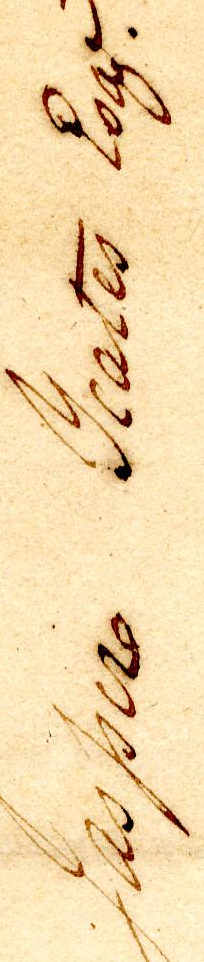Jasper Yeates Esq^r.
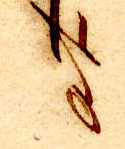at
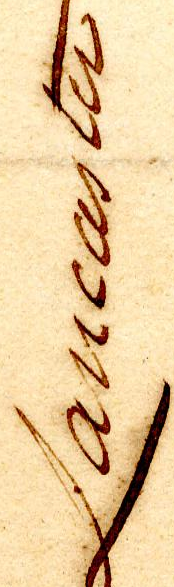Lancaster
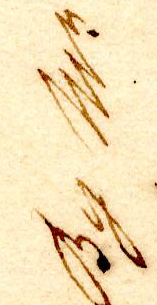By M^r:
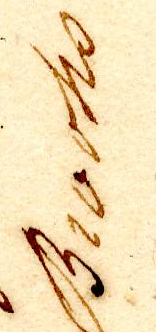Brooks
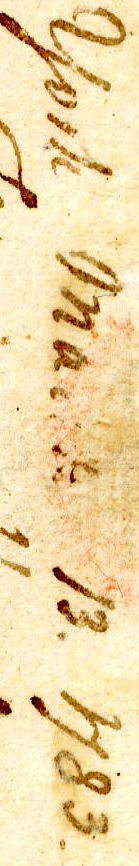York March 13. 1783.
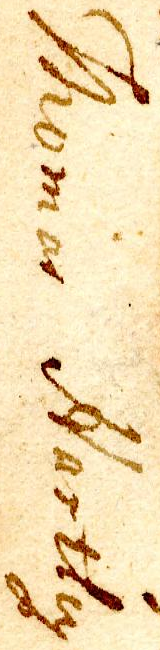Thomas Hartley
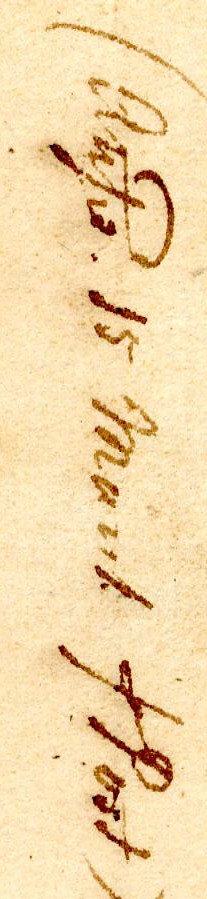(Ans^d. 15 March per Post)
